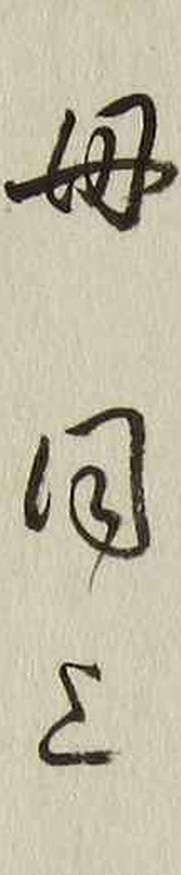母同上
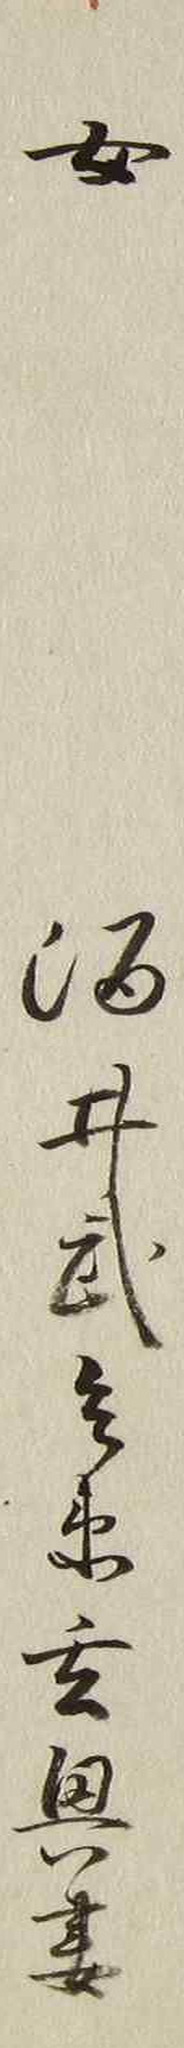女酒井武兵衛玄興妻
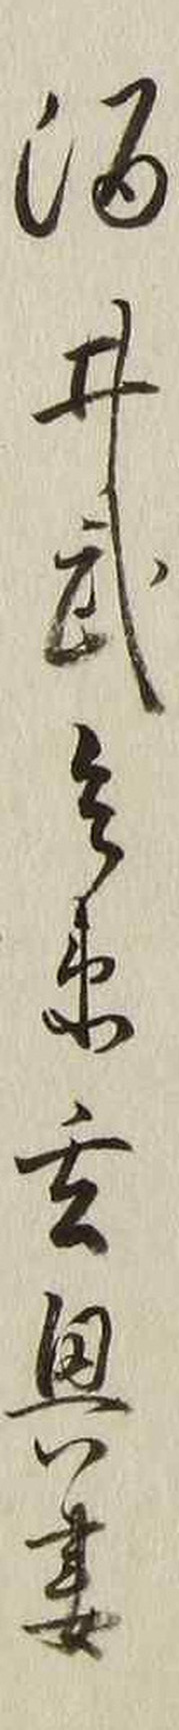女酒井武兵衛玄興妻
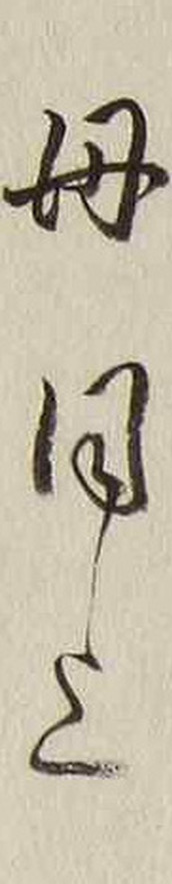母同上

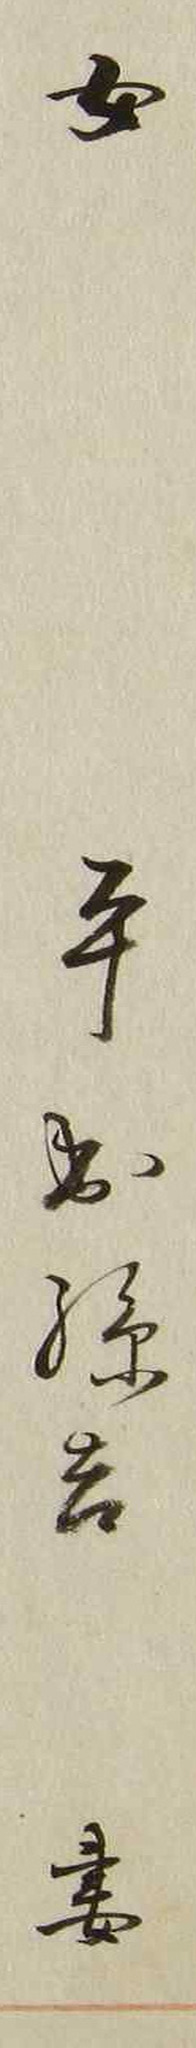女平出孫吉妻
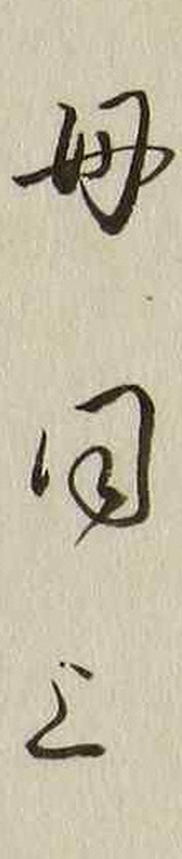母同上
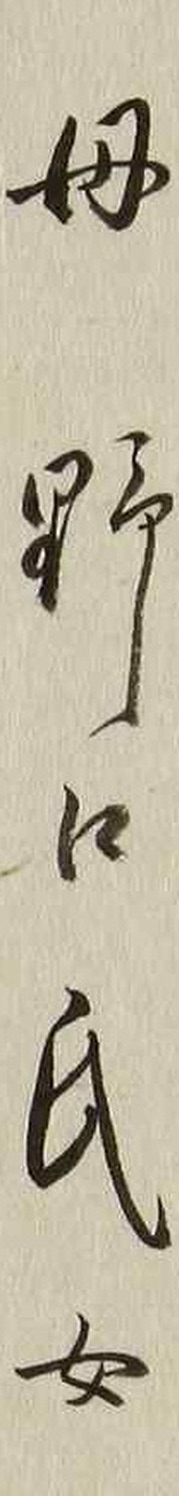母野口氏女
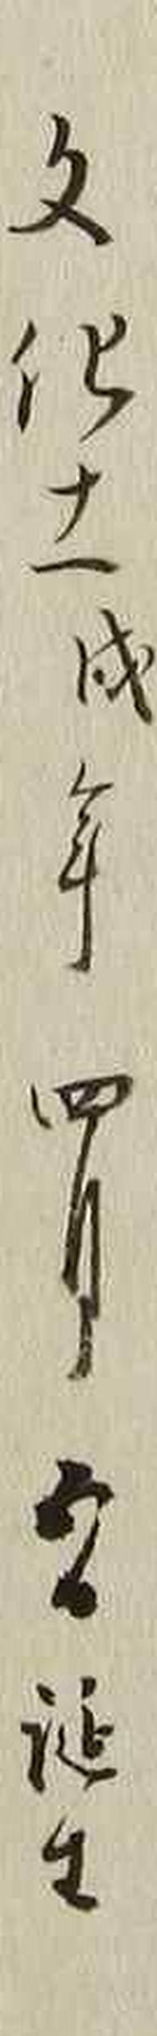文化十一戌年四月五日誕生
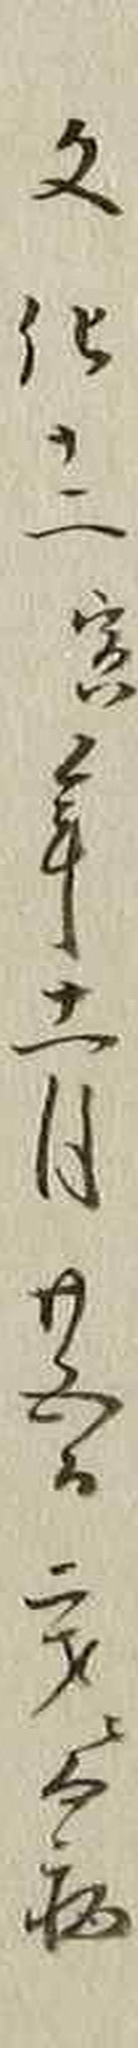岩城某文化十二寅年十一月廿五日二才に而病
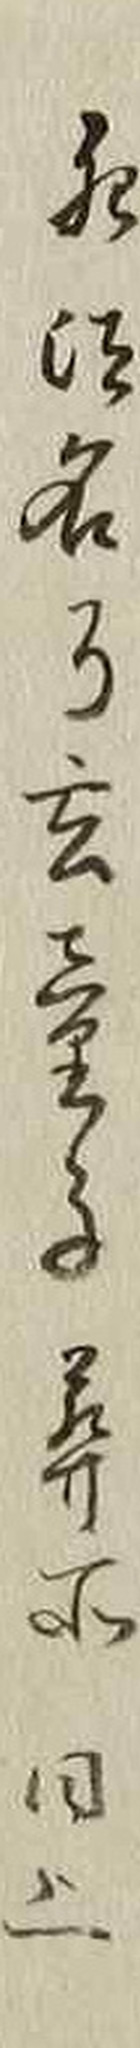死法名了玄童子葬所同上
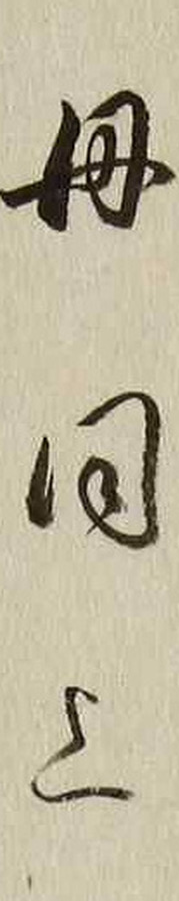母同上
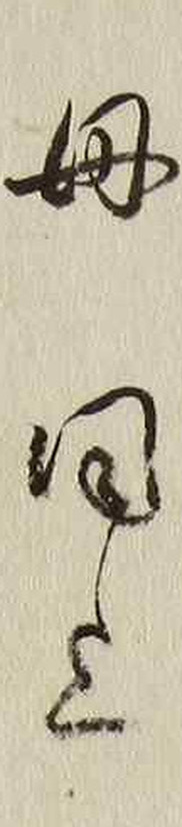母同上
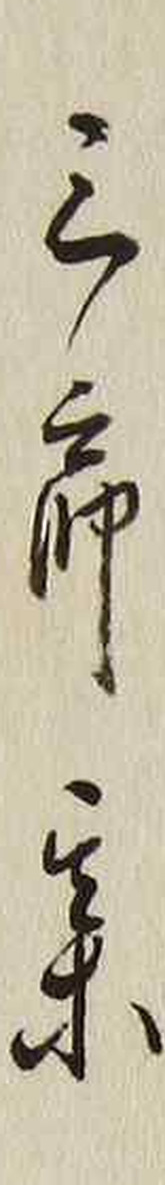三郎某
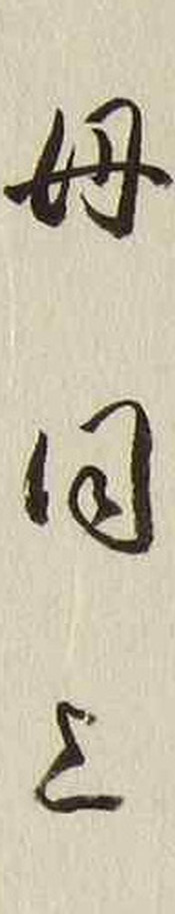母同上
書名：諸士系譜　巻之159　な之部1
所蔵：会津若松市立会津図書館
